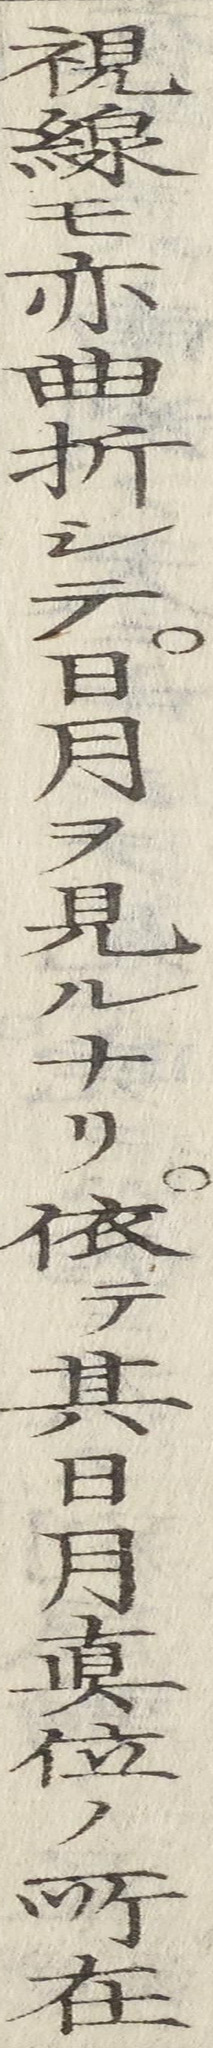視線モ亦曲折シテ。日月ヲ見ルナリ。依テ其日月真位ノ所在
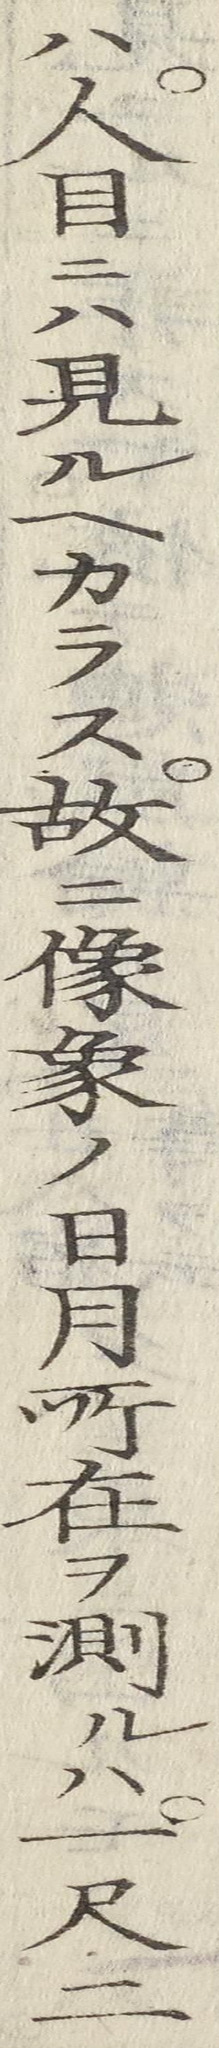ハ。人目ニハ見ルヘカラス。故ニ像象ノ日月所在ヲ測ルハ。一尺ニ
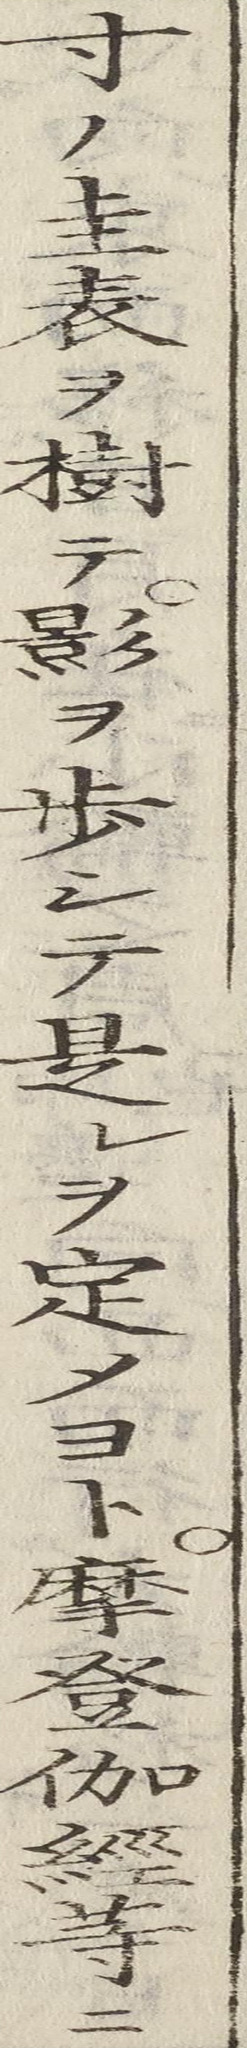寸ノ圭表ヲ樹テ。影ヲ歩シテ是レヲ定メヨト。摩登伽経等ニ
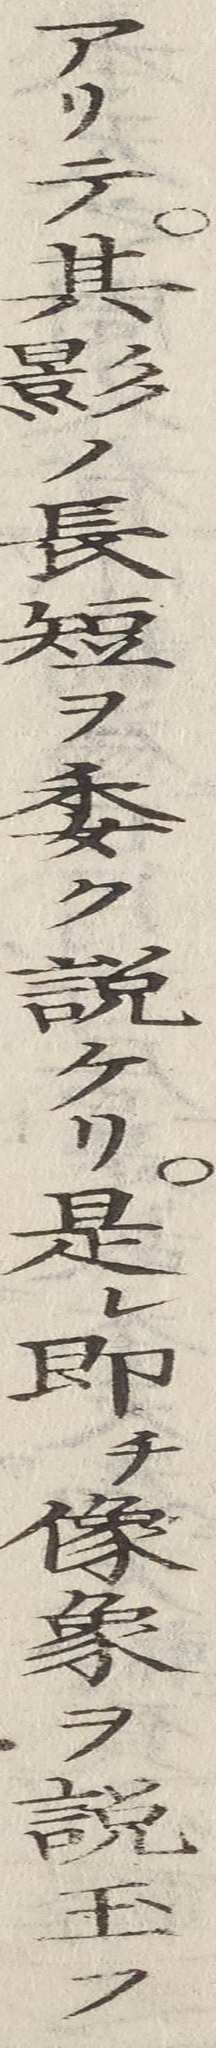アリテ。其影ノ長短ヲ委ク説ケリ。是レ即チ像象ヲ説玉フ
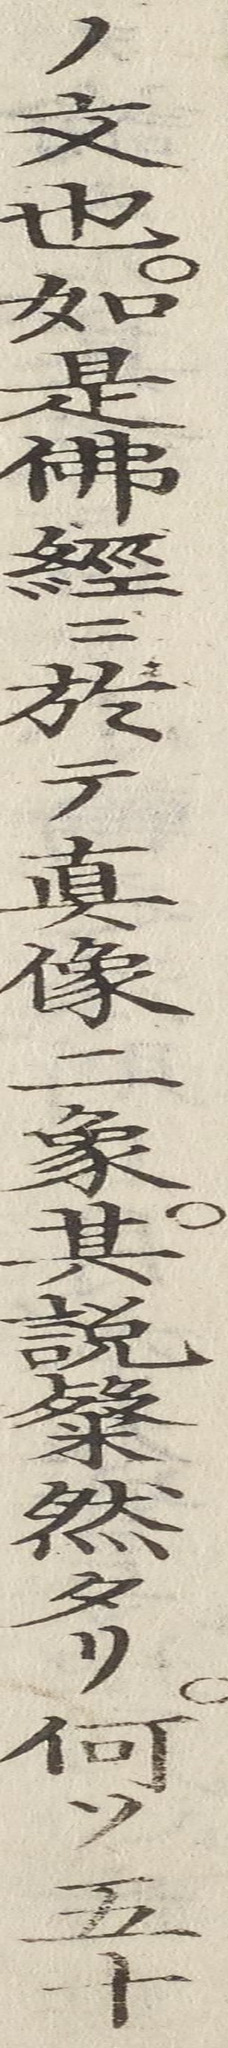ノ文也、如是仏教ニ於テ真像ニ象。其説粲然タリ。何ソ五十
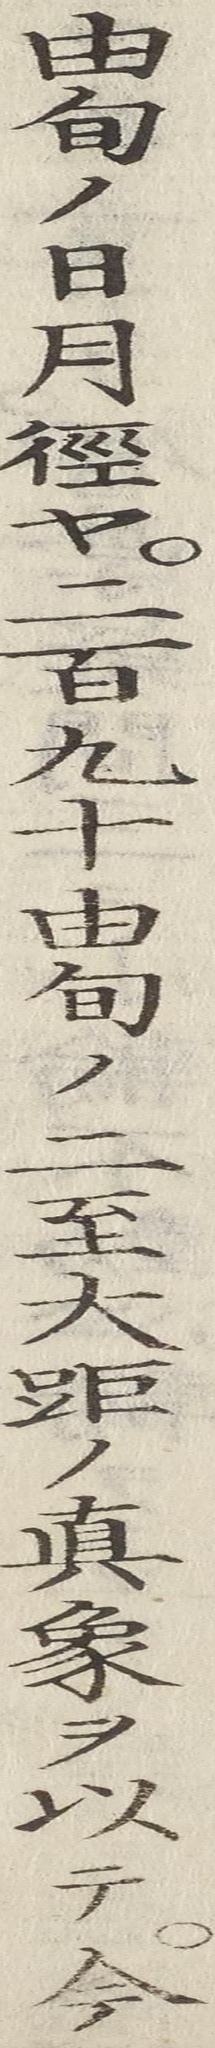由旬ノ日月経ヤ。二百九十由旬ノニ至大距ノ真象ヲ以テ。今
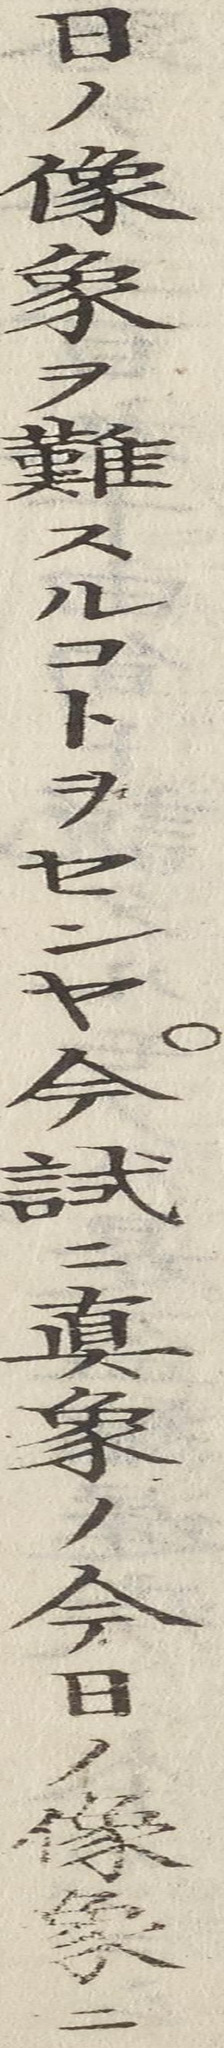日ノ像象ヲ難スルコトヲセンヤ。今試ニ真象ノ今日ノ像象ニ
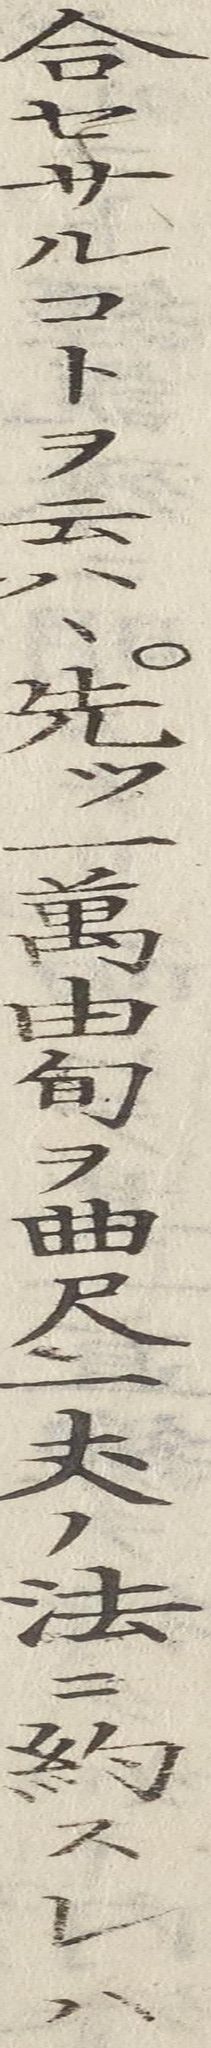合セサルコトヲ云ハヽ。先ツ一万由旬ヲ曲尺一丈ノ法ニ約スレハ
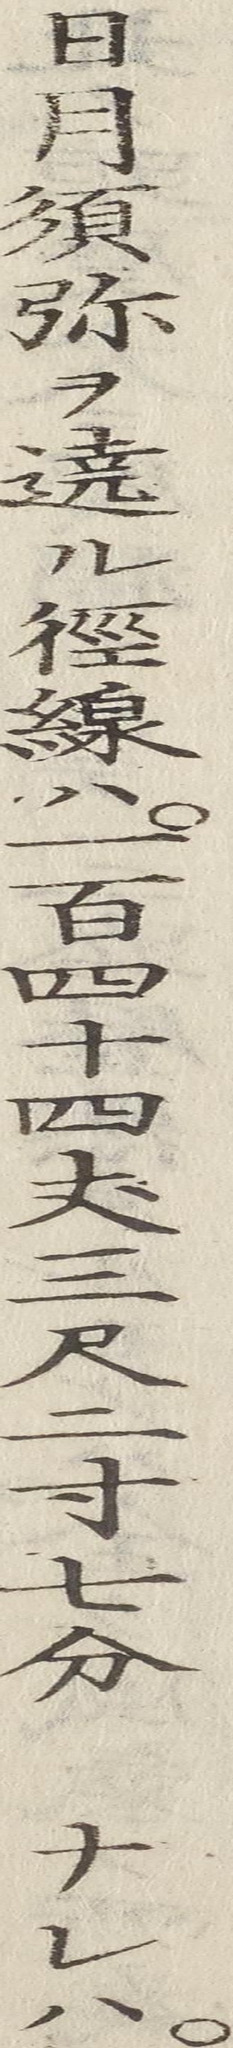日月須弥ヲ遶ル経線ハ。一百四十四丈三尺二寸七分ナレハ。
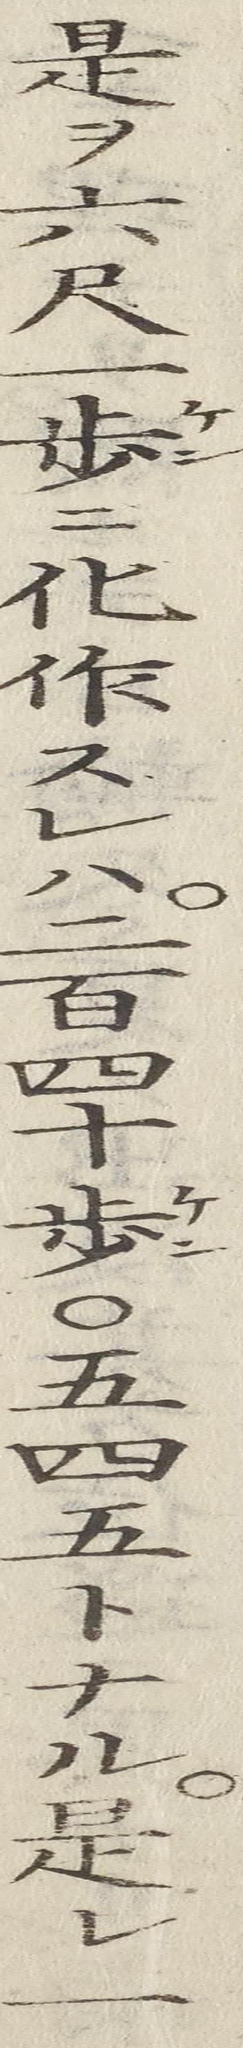是ヲ六尺一歩ニ化作スレハ。二百四十歩〇五四五トナル。是レ一
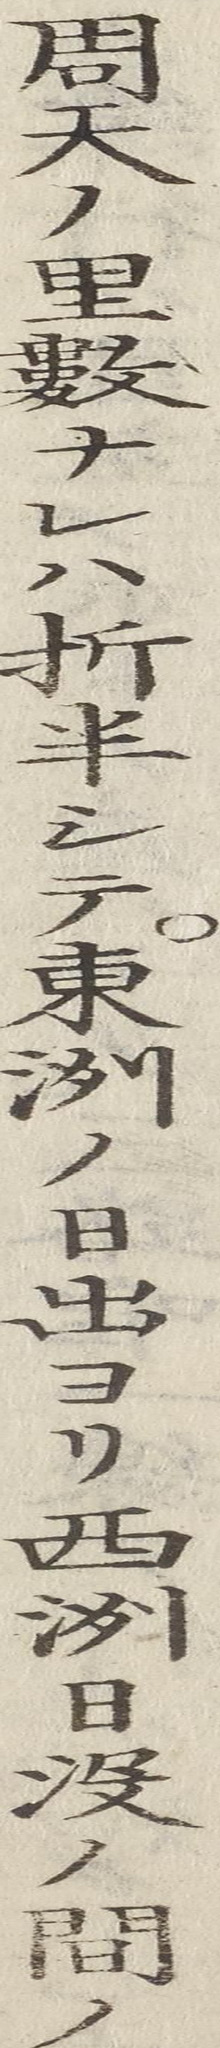周天ノ里数ナレハ折半シテ。東洲ノ日出ヨリ西洲日没ノ間ノ
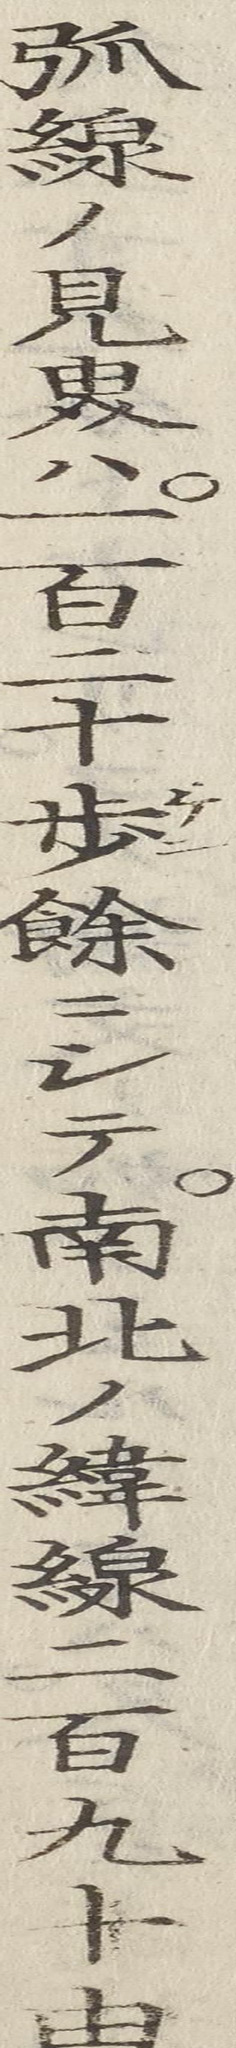弧線ノ見界ハ。一百二十歩余ニシテ。南北ノ緯線二百九十由

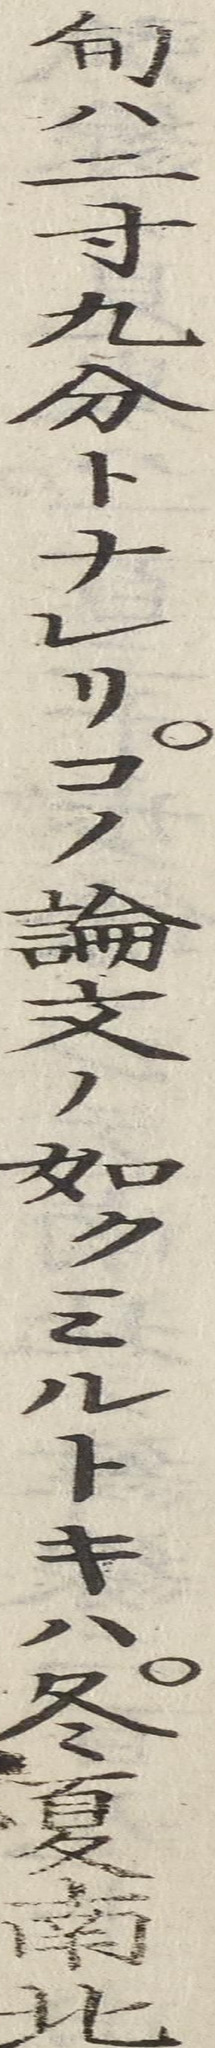旬ハ二寸九分トナレリ。コノ論文ノ如クミルトキハ。冬夏南北
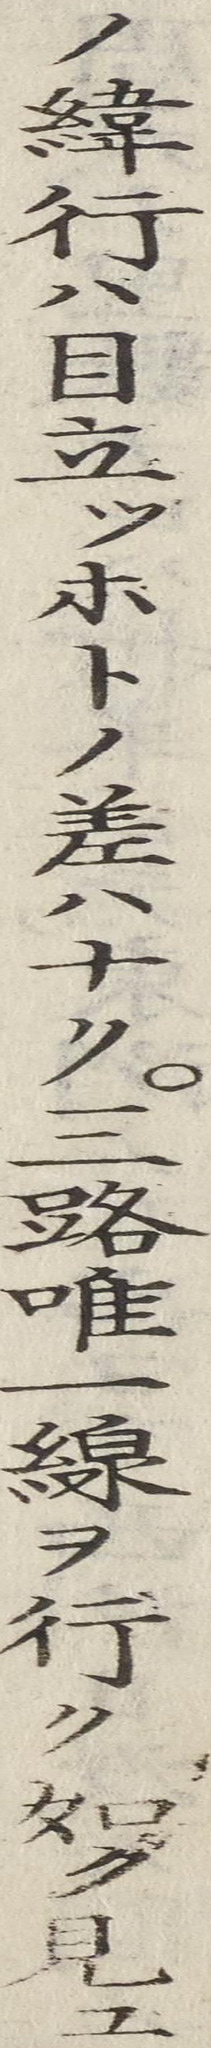ノ緯行ハ目立ツホトノ差ハナク。三路唯一線ヲ行ク如ク見ユ
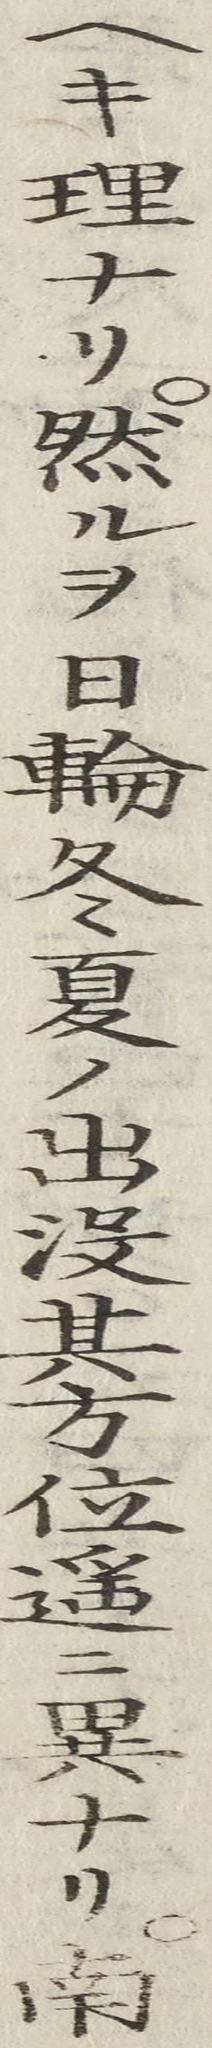ヘキ理ナリ。然ルヲ日輪冬夏ノ出没其方位遥ニ異ナリ。南
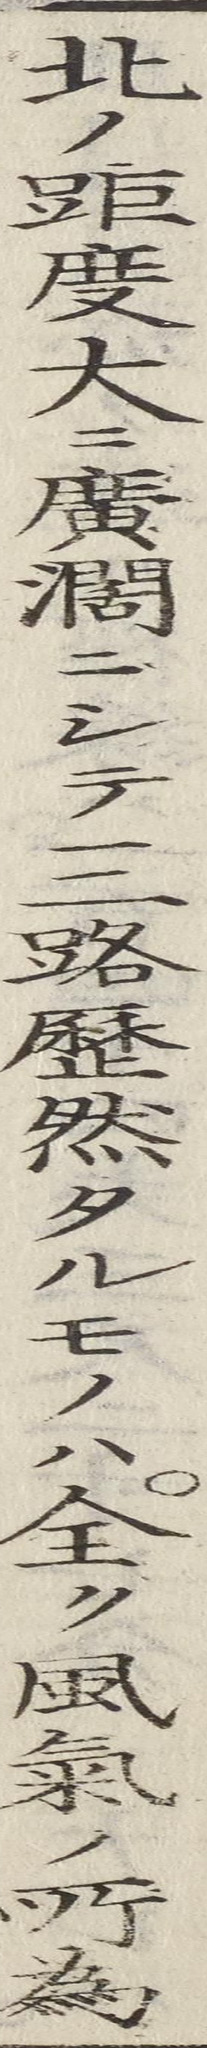北ノ距度大ニ広濶ニシテ三路歴然タルモノハ。全ク風気ノ所為
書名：護法新論　二編　上
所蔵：東京大学地震研究所図書室 Earthquake Research Institute Library, The University of Tokyo, JAPAN
